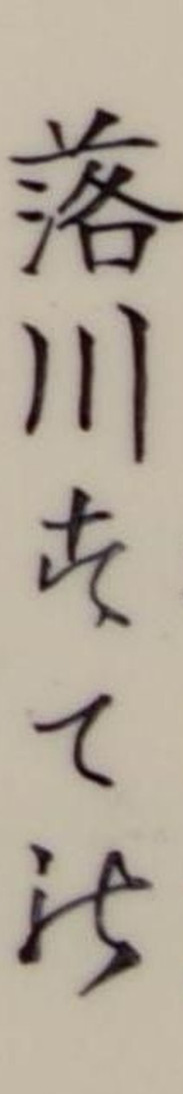落川すての
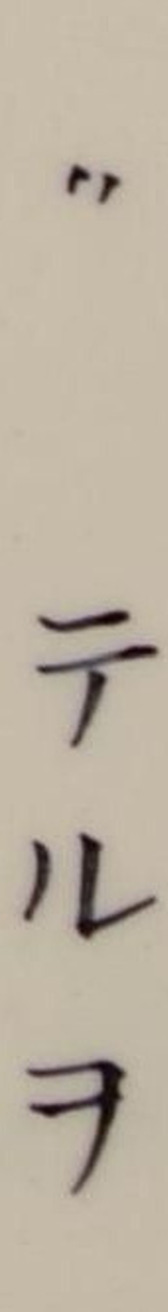テルヲ
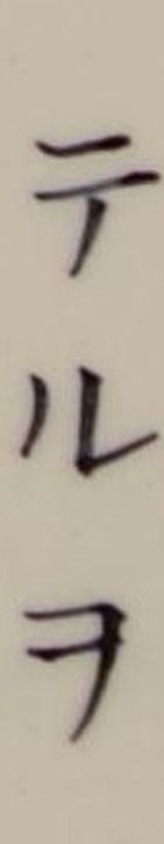テルヲ
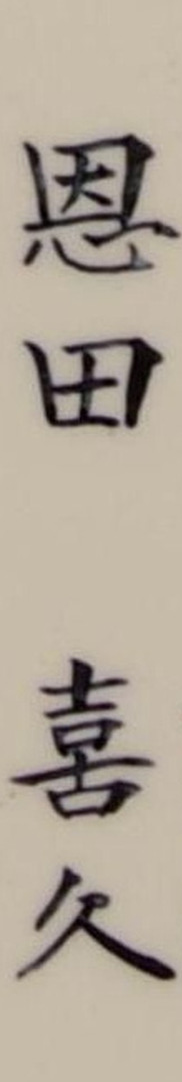恩田喜久
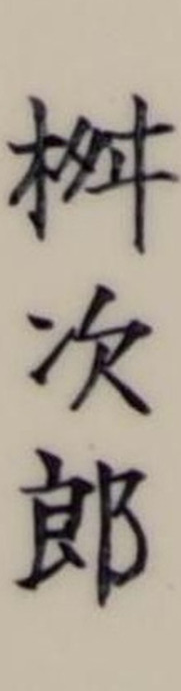桝次郎
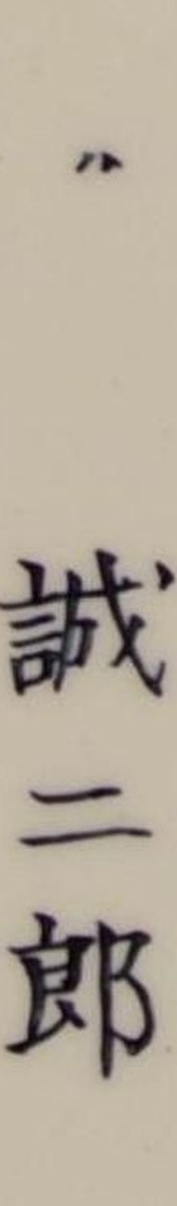誠二郎
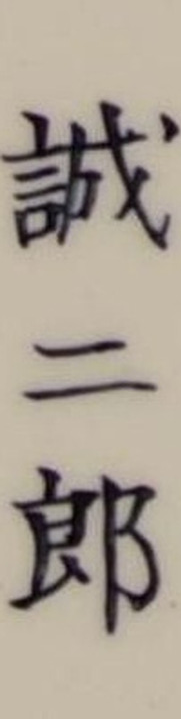誠二郎
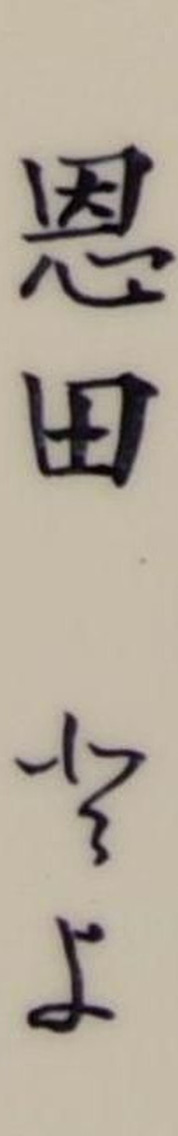恩田とよ
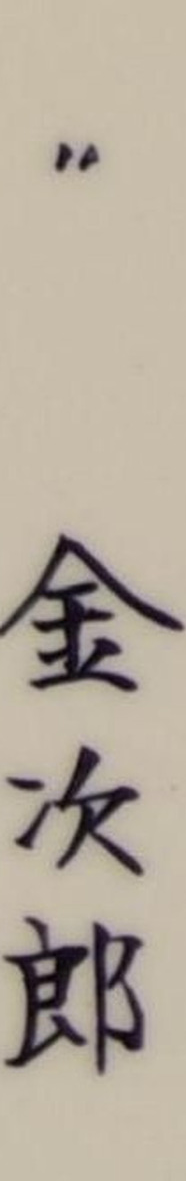金次郎
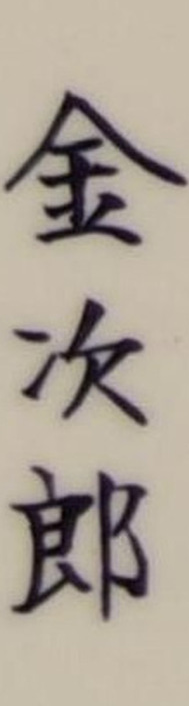金次郎
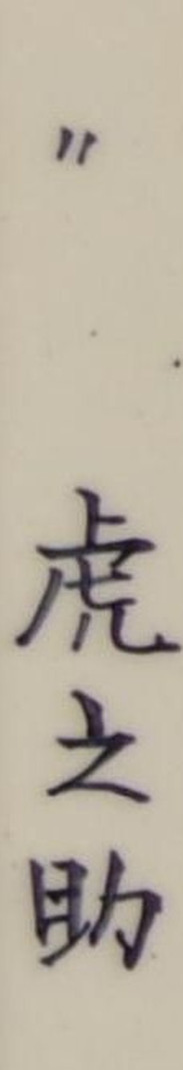虎之助
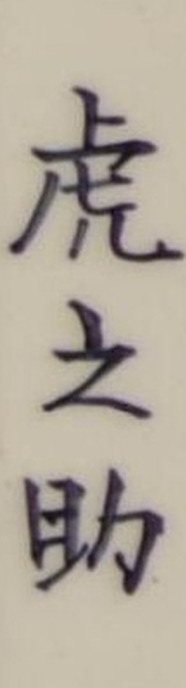虎之助

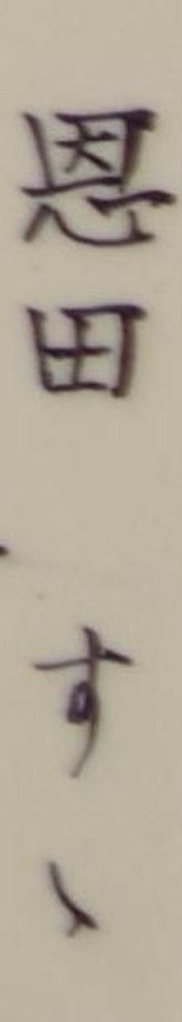恩田すゝ
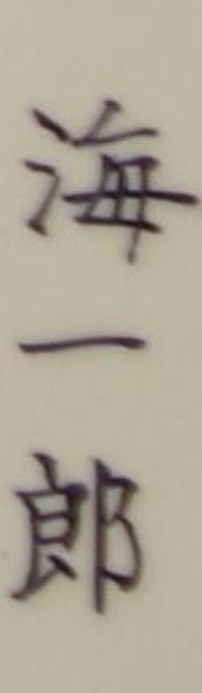海一郎
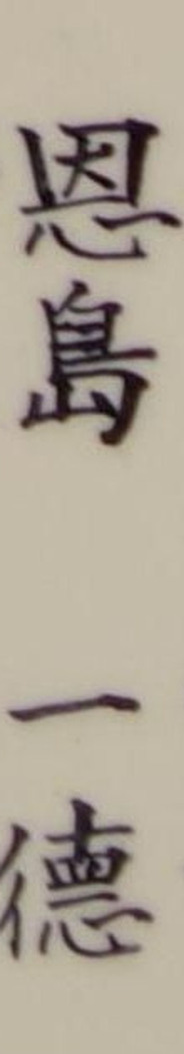恩島一徳
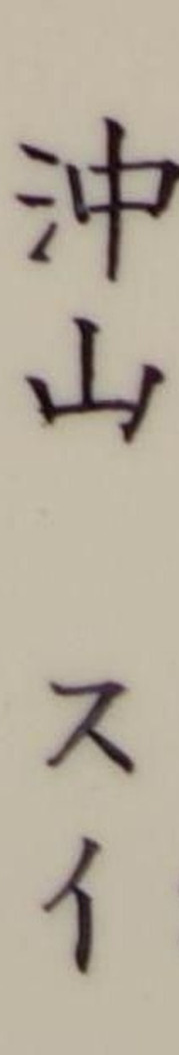沖山スイ
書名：E~L
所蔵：高野山金剛峯寺
